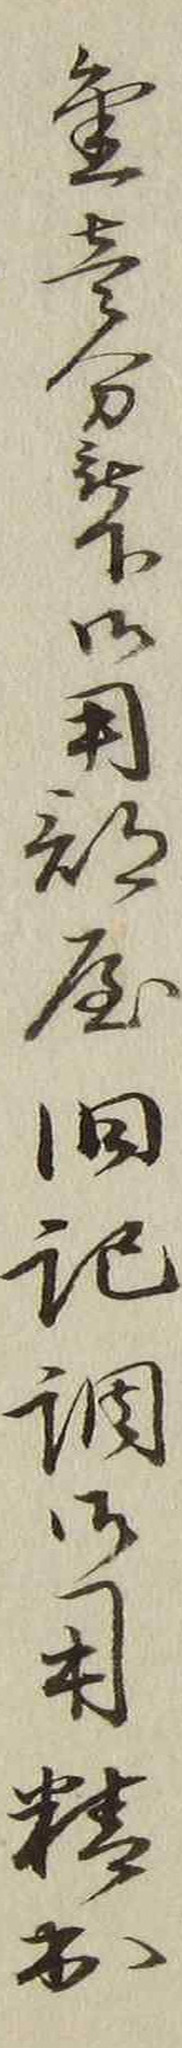金壱分被下御用部屋旧記調御用精出
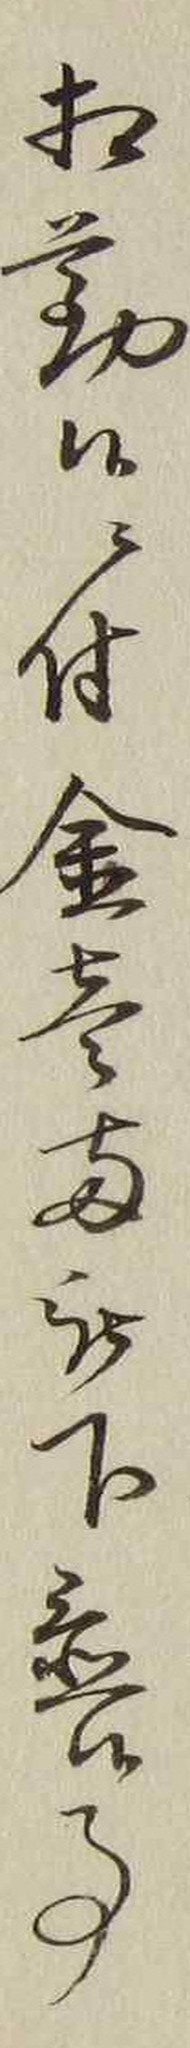相勤候ニ付金壱両被下置候事
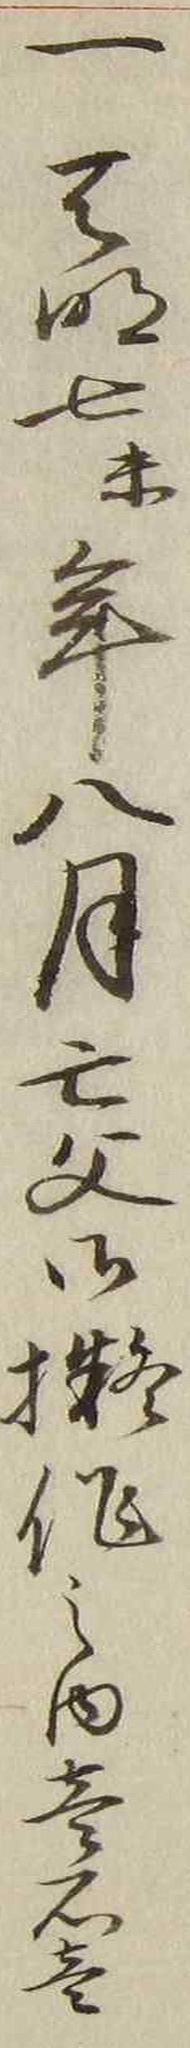一天明七未年八月亡父御擬作之内壱石壱

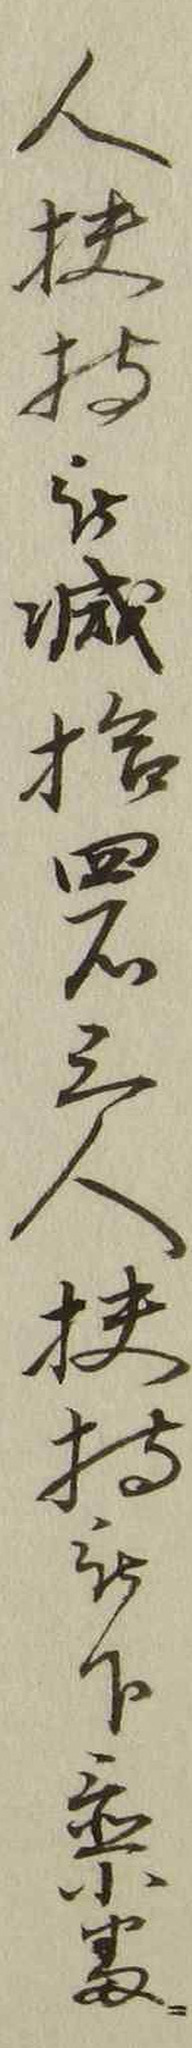人扶持被減拾四石三人扶持被下置小番
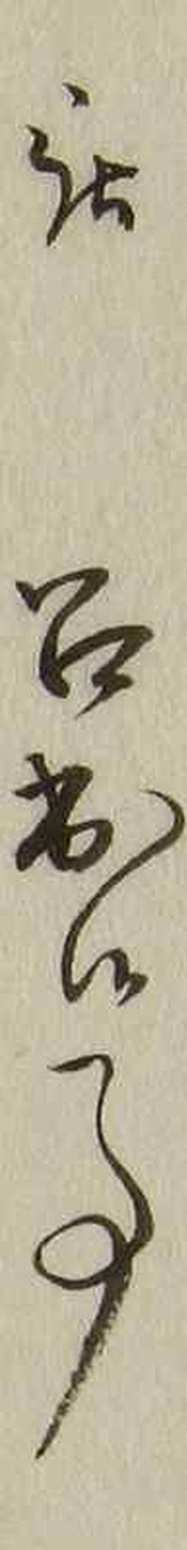被召出候事
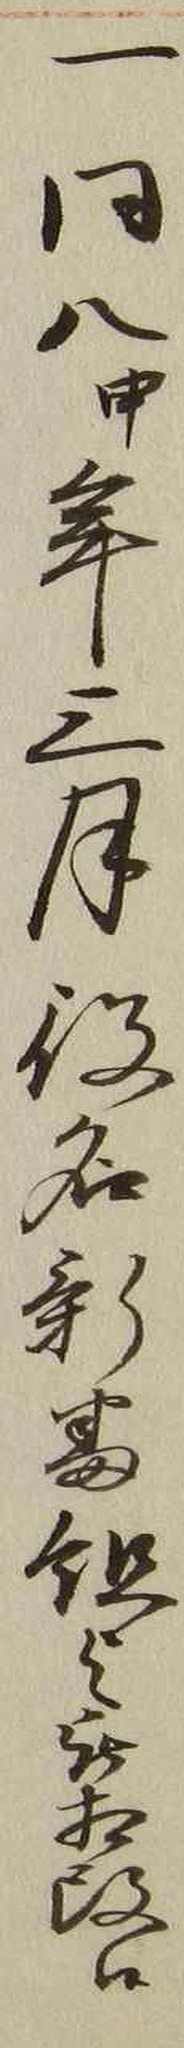一同八申年三月役名新番組与被相改候
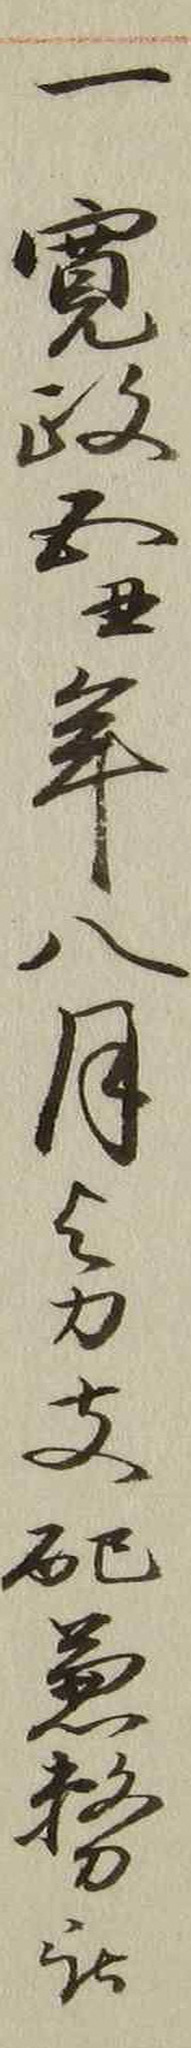一寛政五丑年八月与力支配兼務被
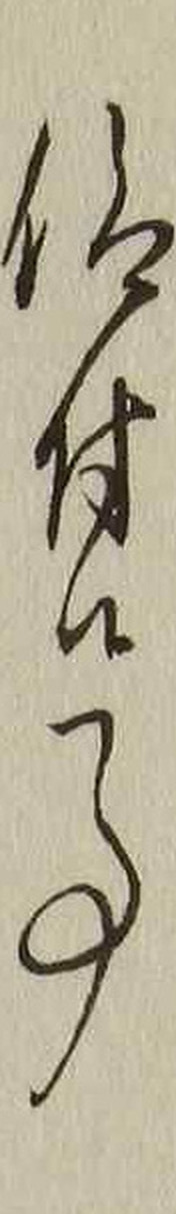仰付候事
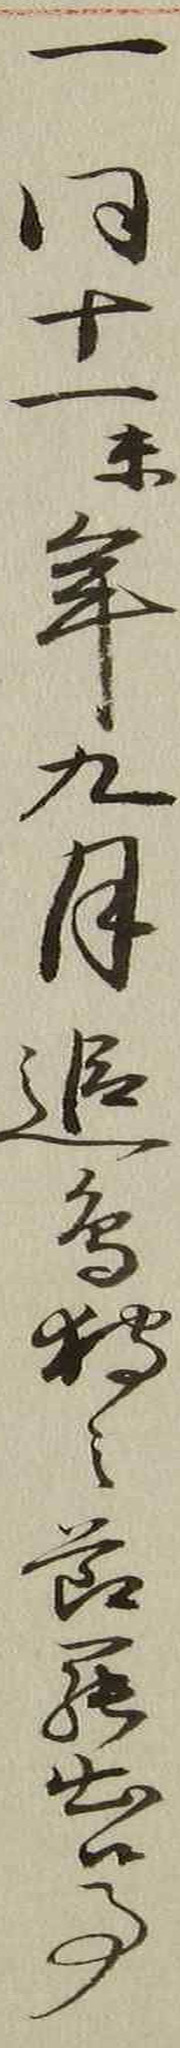一同十一未年九月追鳥狩之節罷出候事
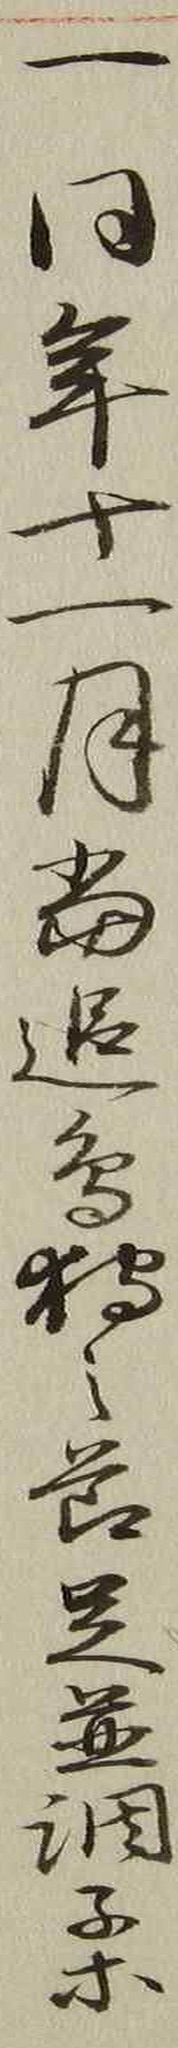一同年十一月当追鳥狩之節足並調子等
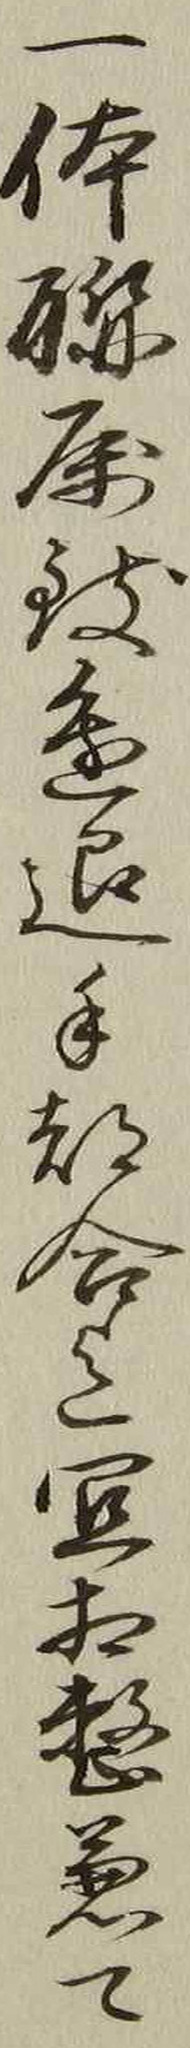一体聯属致進退手都合迄宜相整兼て
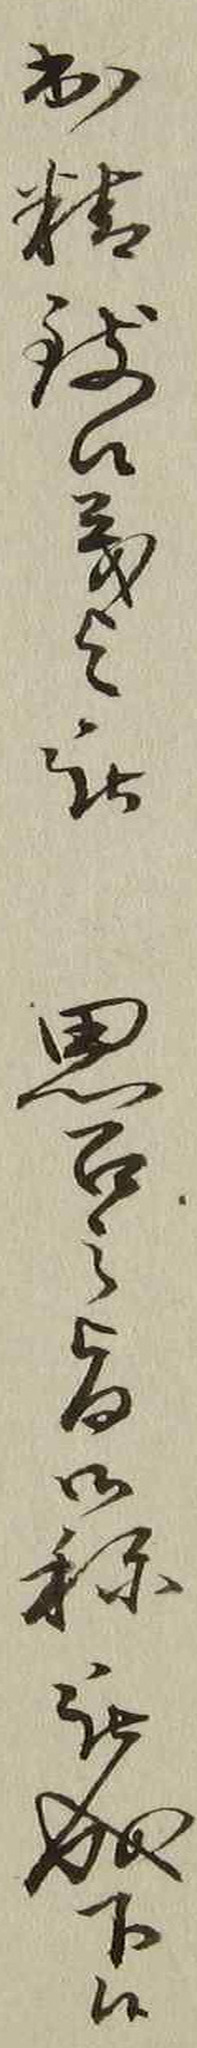出精致候義与被思召之旨御称被成下候
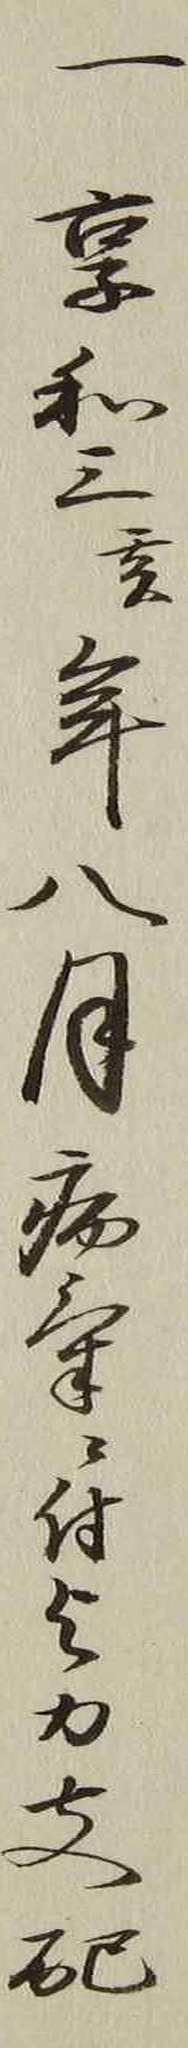一享和三亥年八月病気ニ付与力支配
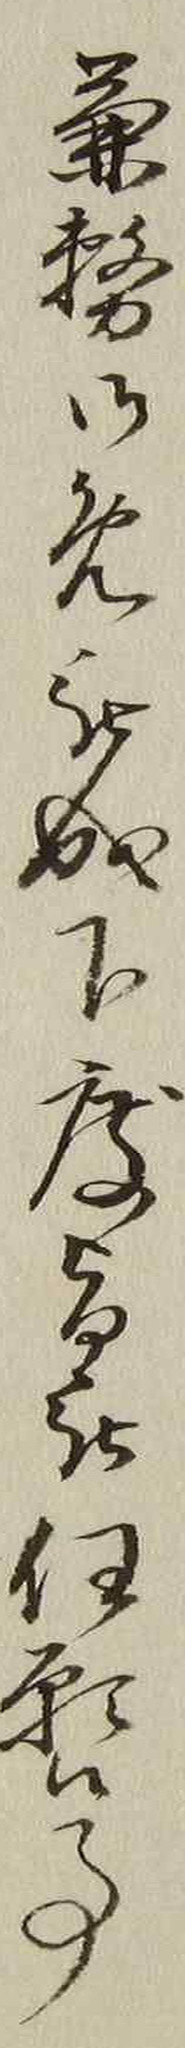兼務御免被成下度旨被伺願候事
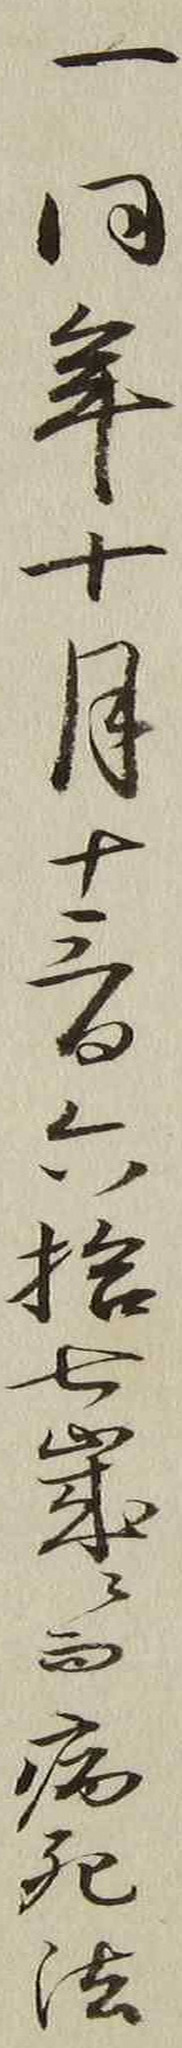一同年十月十三日六拾七歳ニ而病死法
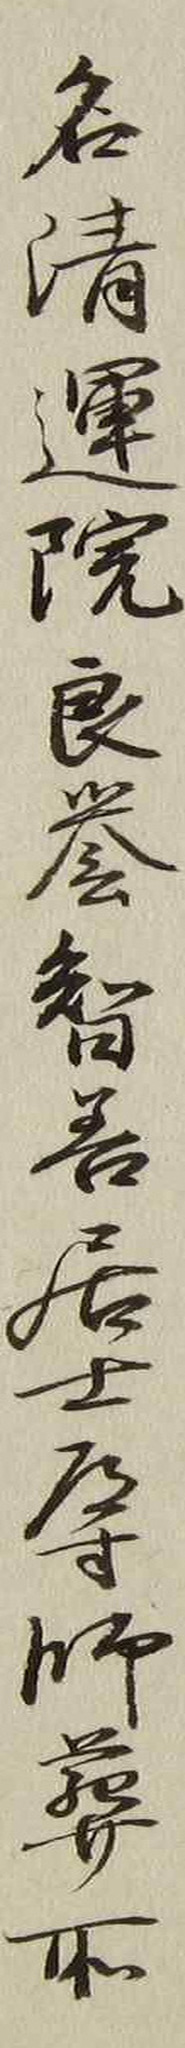名清運院良誉智善居士導師葬所
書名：諸士系譜　巻之114　か之部22
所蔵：会津若松市立会津図書館
